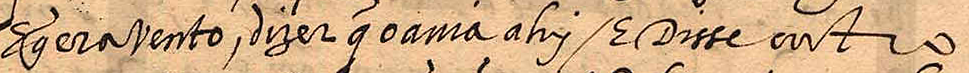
E q̅ era vento, dizer q̅ o auia ahy / E Disse outro
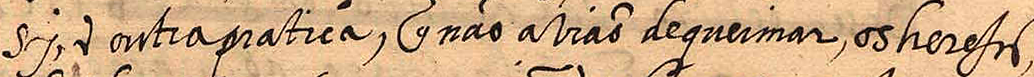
sy, e̅ outra pratica, q̅ não aviaõ de queimar, os hereJes,
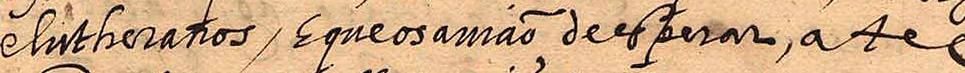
e lutheranos / E que os auião de esperar, atee
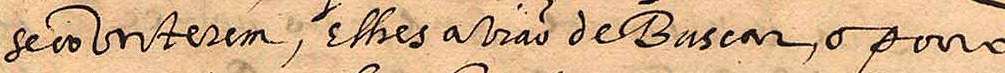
se c̅overterem, E lhes avião de Buscar, o pouo
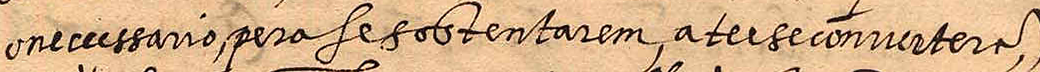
o neçeessario, pera se sostentarem, atee se converterē,
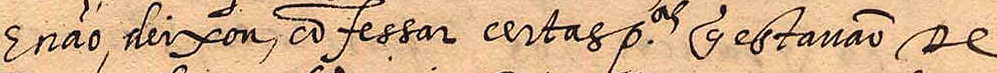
E não, deixou, co̅fessar certas p.as q̅ estauão De
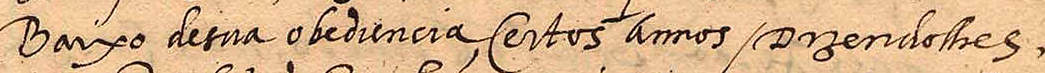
Baixo de sua obediencia, Certos annos / Dizendolhes,
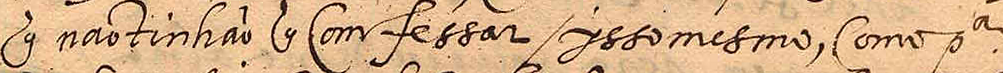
q̅ não tinhão q̅ Comfessar / ysso mesmo, Como pa.
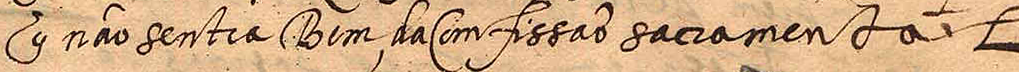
q̅ não sentia Bem, da Comfissaõ sacramentaL
